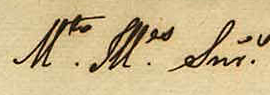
M.to Ill.es Snr.es
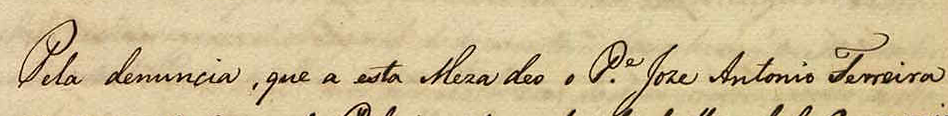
Pela denuncia, que a esta Meza deo o P.e Joze Antonio Ferreira
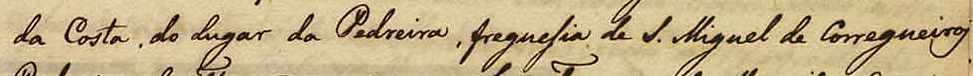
da Costa, do Lugar da Pedreira, freguesia de S. Miguel de Corregueiros
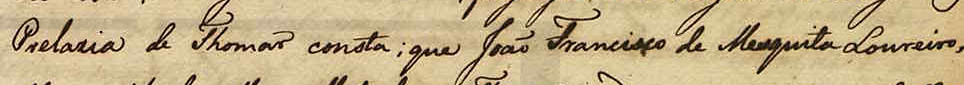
Prelazia de Thomar consta; que Joaõ Francisco de Mesquita Loureiro,
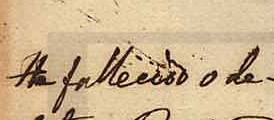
He fallecido o de
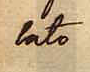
lato
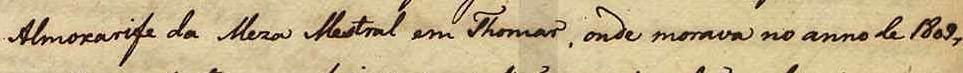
Almoxarife da Meza Mestral em Thomar, onde morava no anno de 1809,
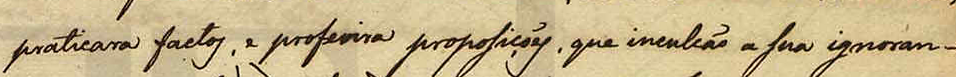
praticara factos, e proferira proposiçoẽs, que inculcaõ a sua ignoran
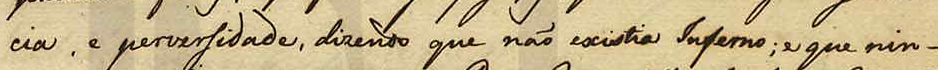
cia, e perversidade, dizendo que naõ existia Inferno; e que nin
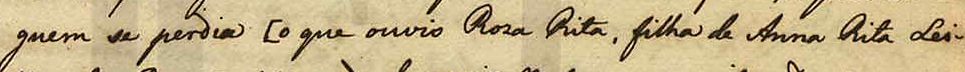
guem se perdia (o que ouvio Roza Rita, filha de Anna Rita Lei
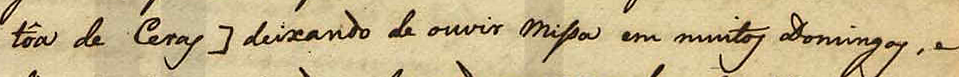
tôa de Ceras) deixando de ouvir missa em muitos Domingos, e
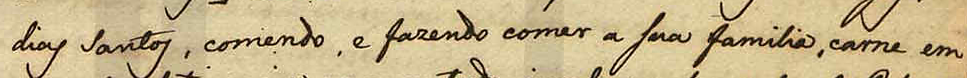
dias santos, comendo, e fazendo comer a sua familia, carne em
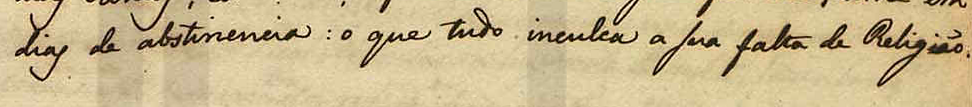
dias de abstinencia: o que tudo inculca a sua falta de Religiaõ.
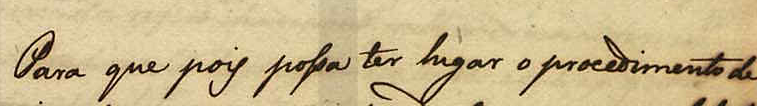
Para que pois possa ter lugar o procedimento de
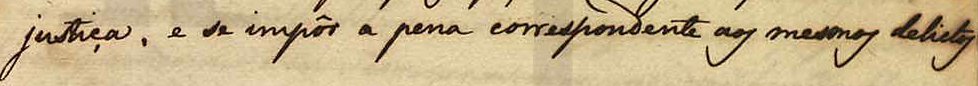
justiça, e se impôs a pena correspondente aos mesmos delictos
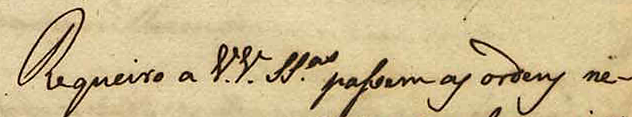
Requeiro a V.V. ss.as passem as ordens ne
